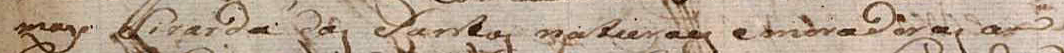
may Lizarda dos Santos naturaes e moradoras am
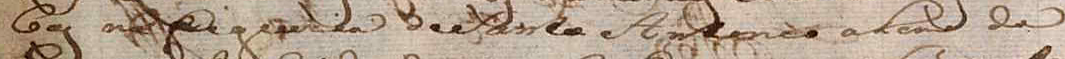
bas na freguezia de Santo Antonio aLem do
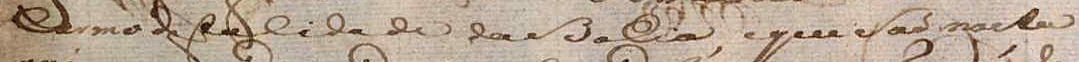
Carmo desta Cidade da Bahia, e que saõ natu
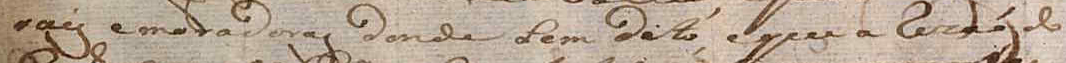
rais, e moradores donde tem dito, e que a rezaõ do
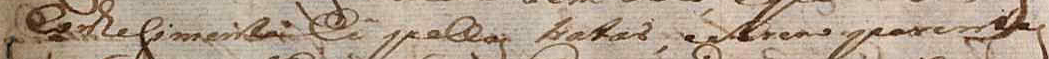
Conhesimento hé pellas tratar, e serem parentas
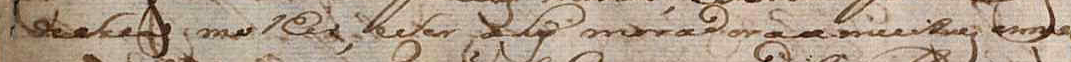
da sua molher, e ser ahy moradora a muitos annos
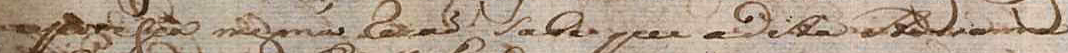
por essa mesma Rezaõ sabe que a dita Adrianna
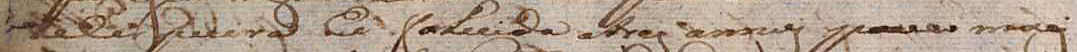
de Ciqueira hé falecida a trez annos pouco mais
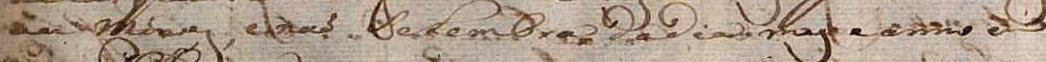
ou menos, e naõ Se lembra do dia, mes e anno em
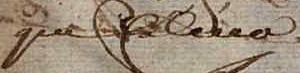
que faleceo
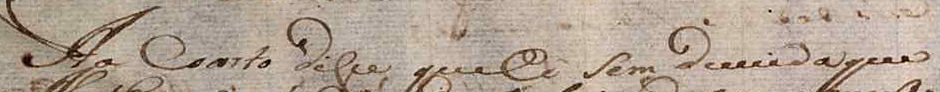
Ao Coarto disse, que hê sem duuida que
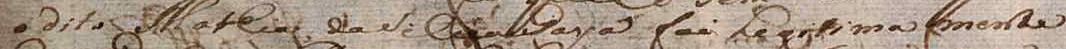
o dito Mathias da Silua Gaya foi Legitimamente
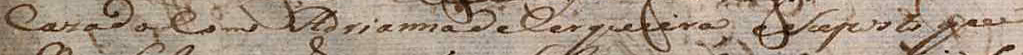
Cazado Com Adrianna de Cerqueira, e suposto que
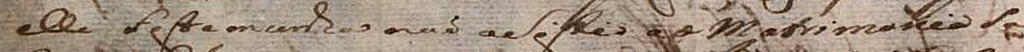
elle testemunha naõ asistio ao Matrimonio sa
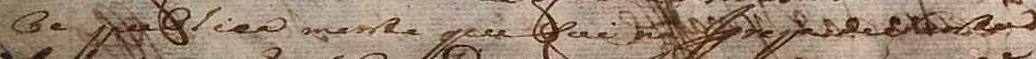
be publicamente que foi na Igreja de Santo
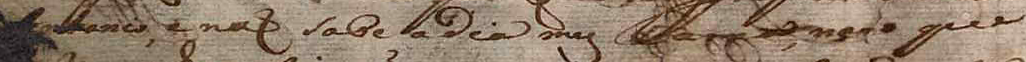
Antonio, e naõ sabe o dia mes anno, nem que
